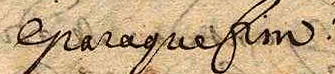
e para que fim?
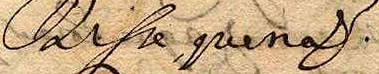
Disse, que naõ.
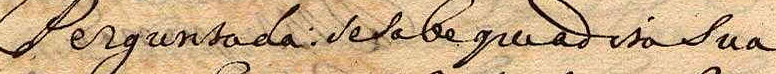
Perguntada: se sabe que a dita sua
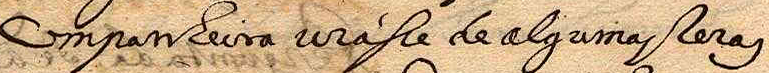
Companheira uzasse de algumas Rezas
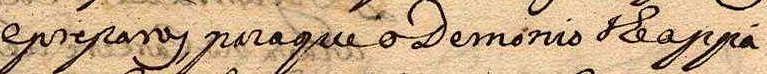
e preparos, para que o Demonio lhe appa
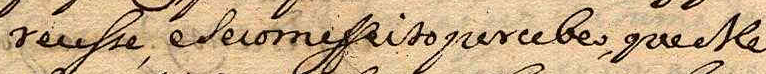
recesse, e se com effeito percebeo, que elle
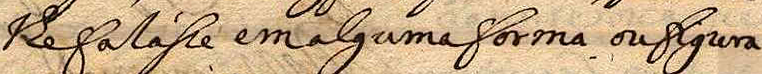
lhe falasse em alguma forma, ou figura?
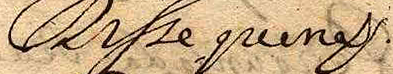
Disse, que naõ.
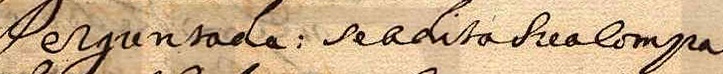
Perguntada: se a dita sua compa
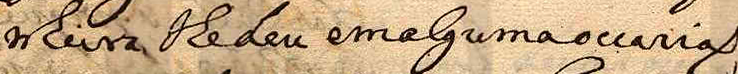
nheira lhe deu em alguma occaziaõ
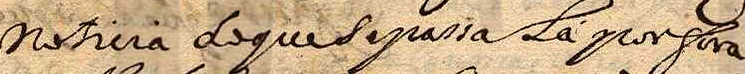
noticia do que se passa Lá por fora,
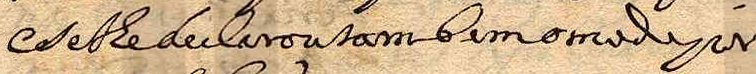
e se lhe declarou tambem o modo por
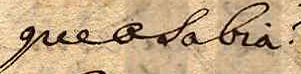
que o sabia?
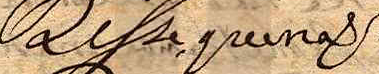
Disse, que naõ.
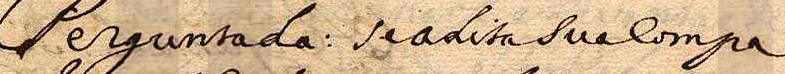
Perguntada: se a dita sua compa
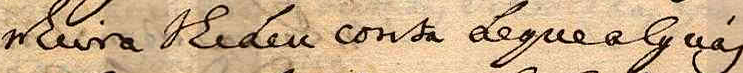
nheira lhe deu conta de que alguās
